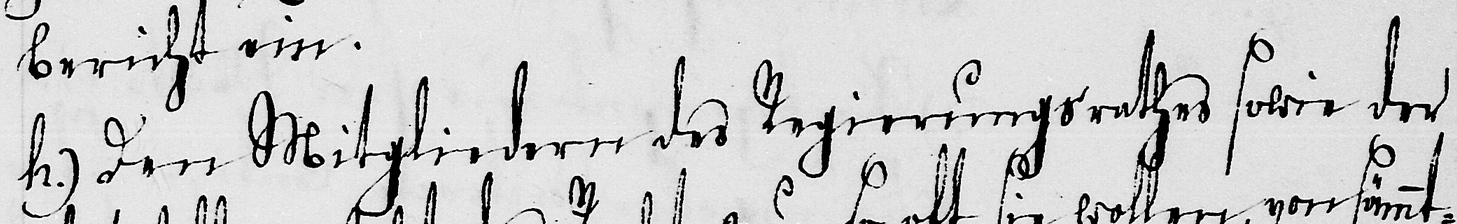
h.) Den Mitgliedern des Regierungsrathes sowie der
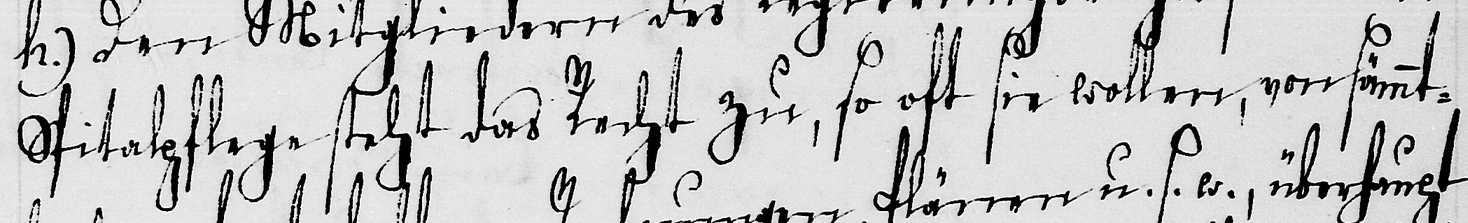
Spitalpflege steht das Recht zu, so oft sie wollen, von säm¬
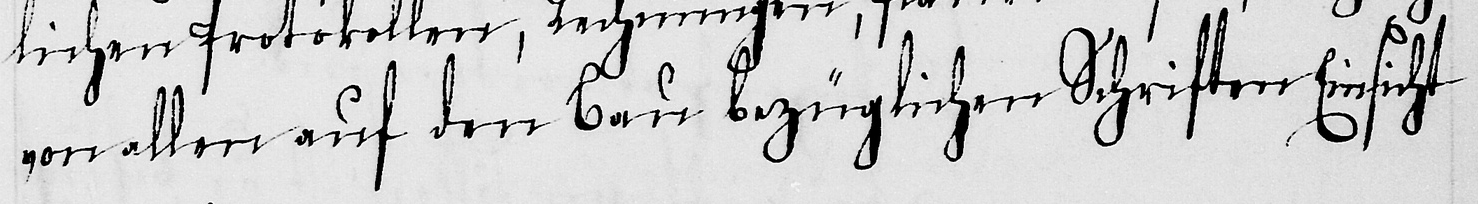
von allen auf den Bau bezüglichen Schriften Einsicht
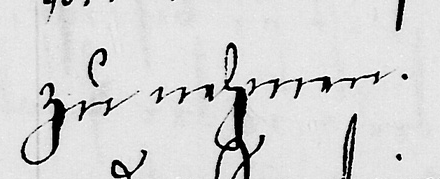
zu nehmen.
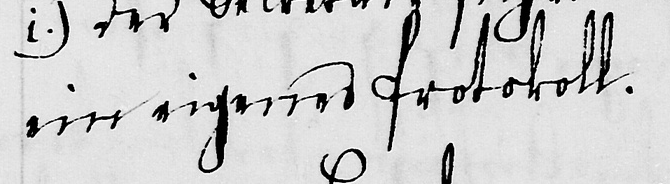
ein eigenes Protokoll.
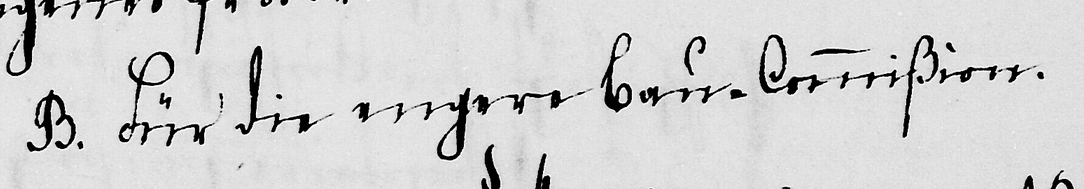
B. Für die engere Bau-Commißion.
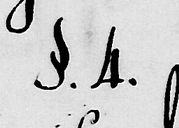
§.4.
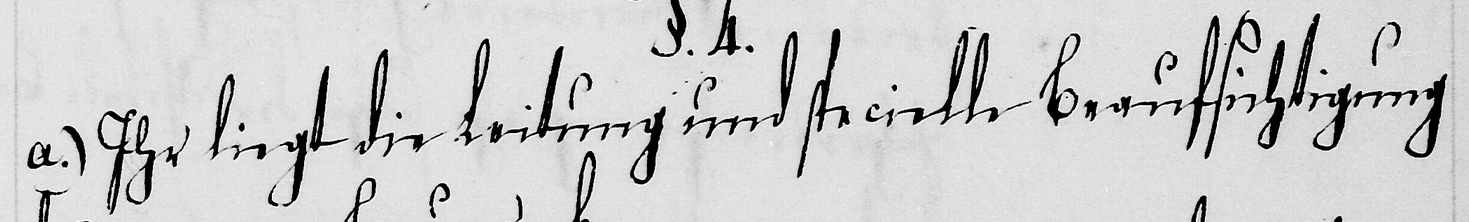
a.) Ihr liegt die Leitung und specielle Beaufsichtigung
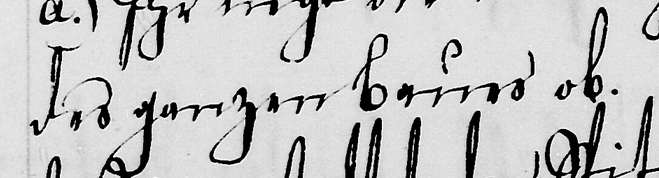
des ganzen Baues ob.
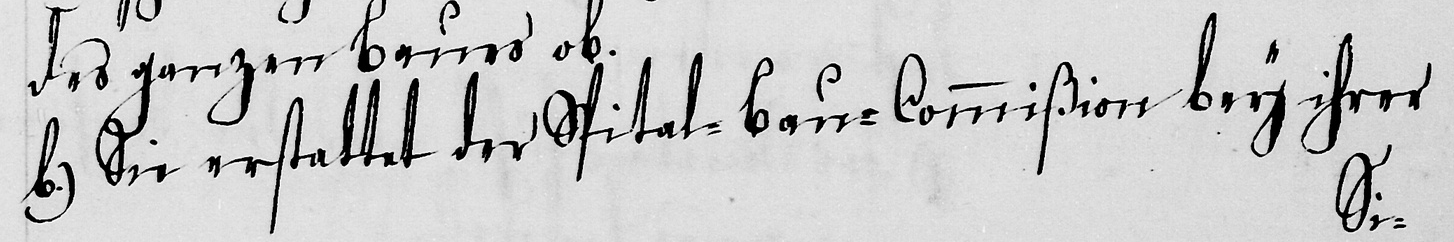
b.) Sie erstattet der Spital-Bau-Commißion bey ihrer
